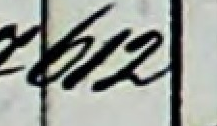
612
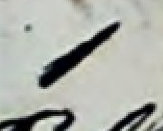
1
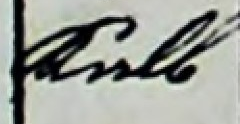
Kalb
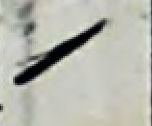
1
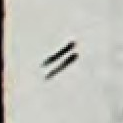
„
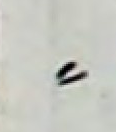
„
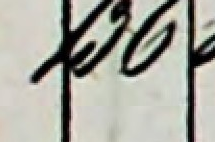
136
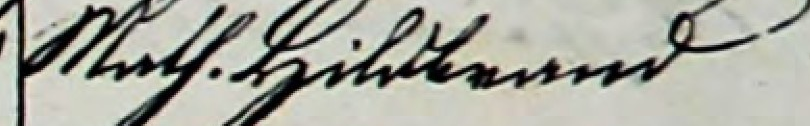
Math. Hildbrand
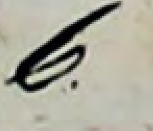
6
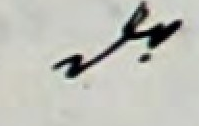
do
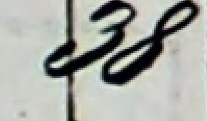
38
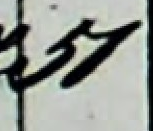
51
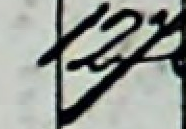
127
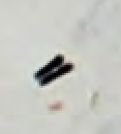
„
